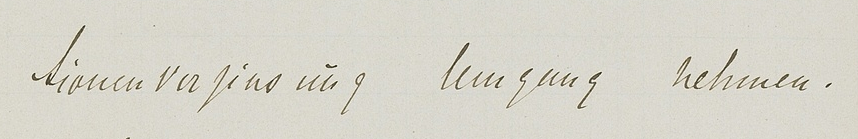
tionenverzinsung Umgang nehmen.
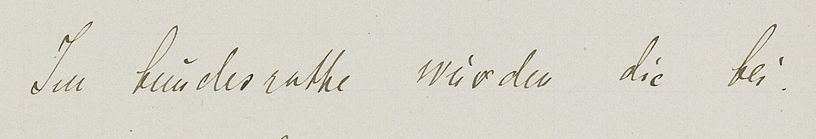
Im Bundesrath wurden die bei-
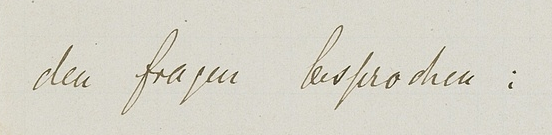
den Fragen besprochen:
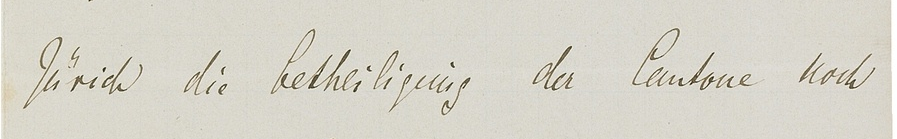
Zürich die Betheiligung der Cantone noch
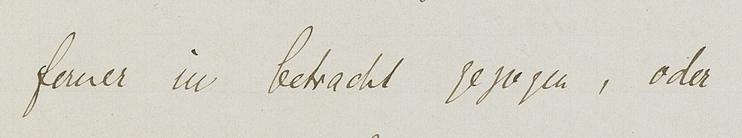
ferner in Betracht gezogen, oder
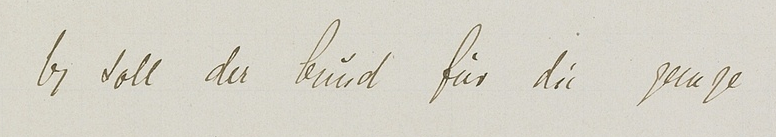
b) soll der Bund für die ganze
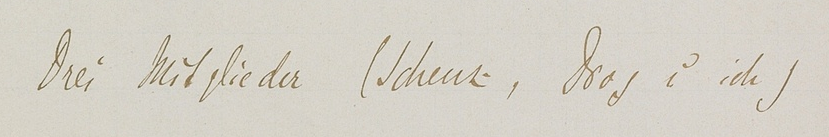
Drei Mitglieder ( Schenk, Droz u ich)
